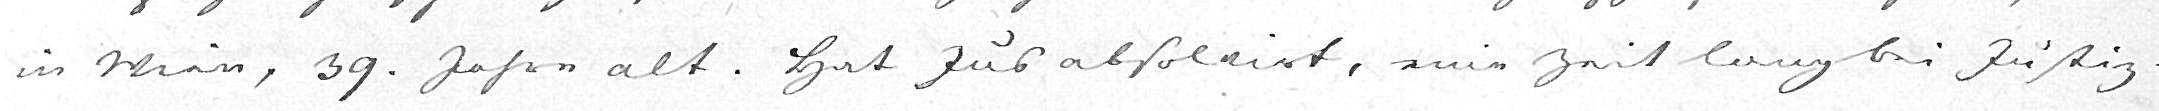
in Wien, 39 Jahre alt. Hat Jus absolvirt, eine Zeit lang bei Justiz-
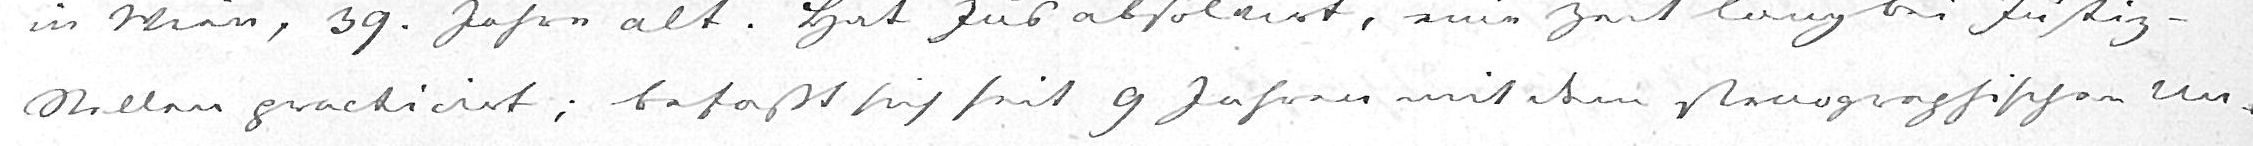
Stellen practicirt; befaßt sich seit 9 Jahren mit dem stenographischen Un-
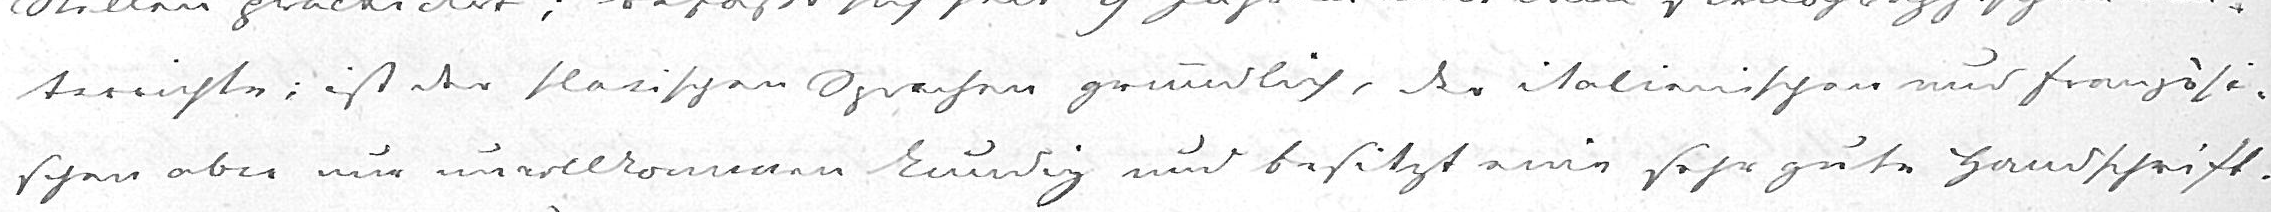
terricht; ist der slavischen Sprachen gründlich, der italienischen und französi-
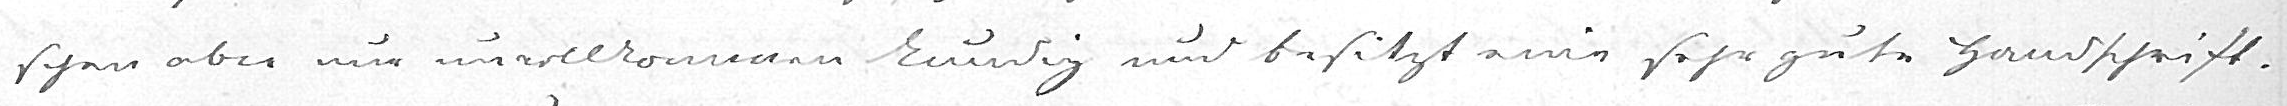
schen aber nur unvollkommen kundig und besitzt eine sehr gute Handschrift.
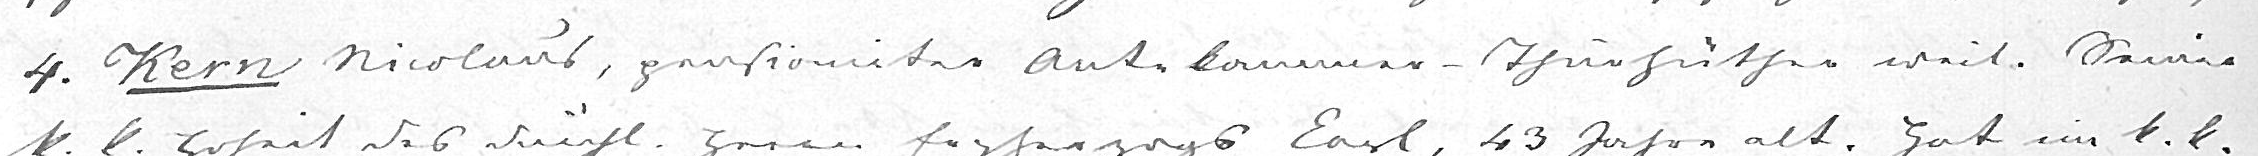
4. Kern, Nicolaus, pensionirter Antekammer-Thürhüther weil. Seiner
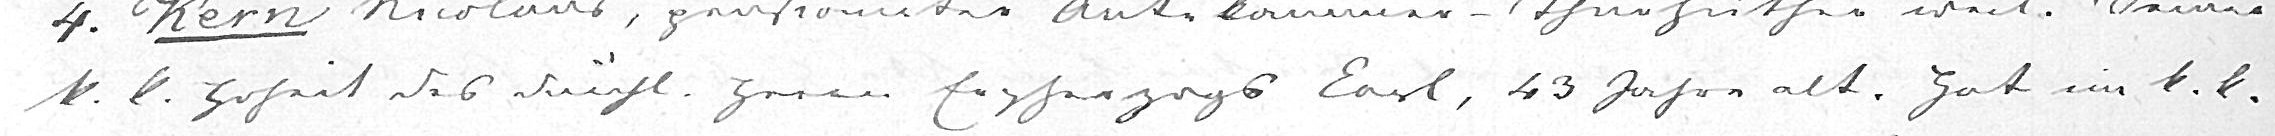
k.k. Hoheit des Durchl. Herrn Erzherzogs Carl, 43 Jahre alt. Hat im k.k.
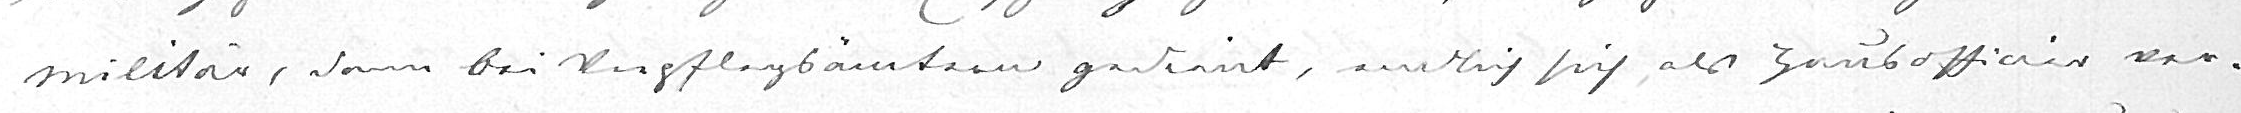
Militär, dann bei Verpflegsämtern gedient, endlich sich als Hausofficier ver-
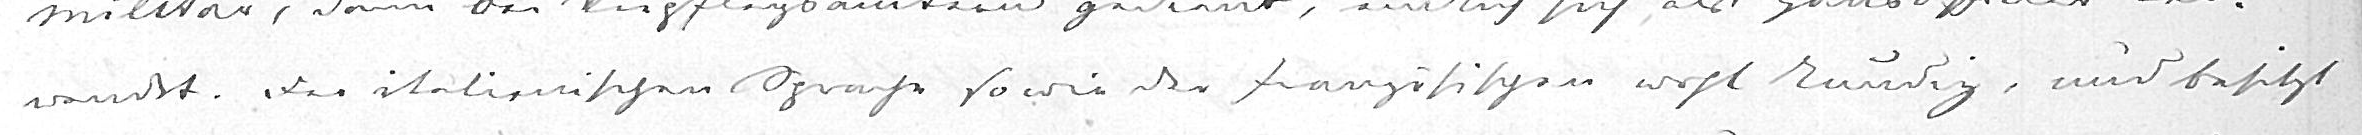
wendet. Der italienischen Sprache sowie der französischen wohl kundig, und besitzt
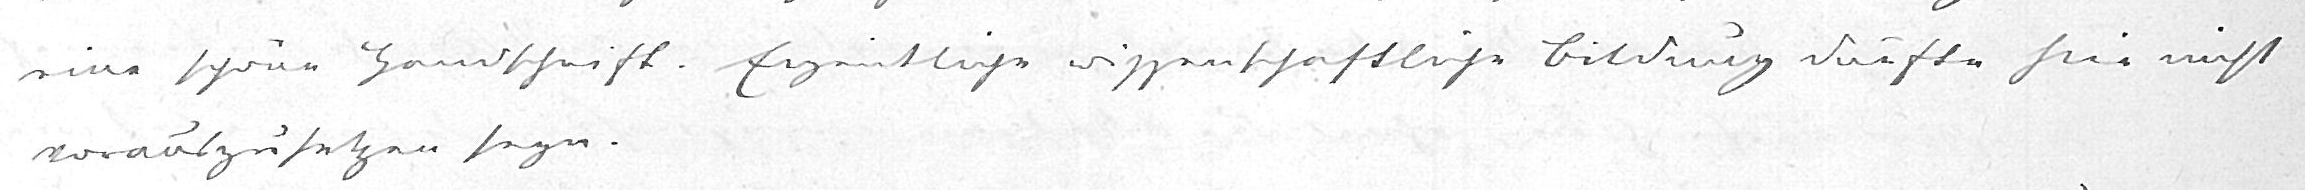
eine schöne Handschrift. Eigentliche wissenschaftliche Bildung dürfte hier nicht
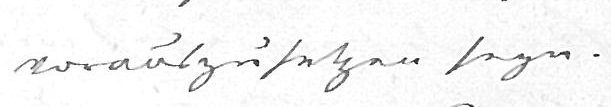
vorauszusetzen seyn.
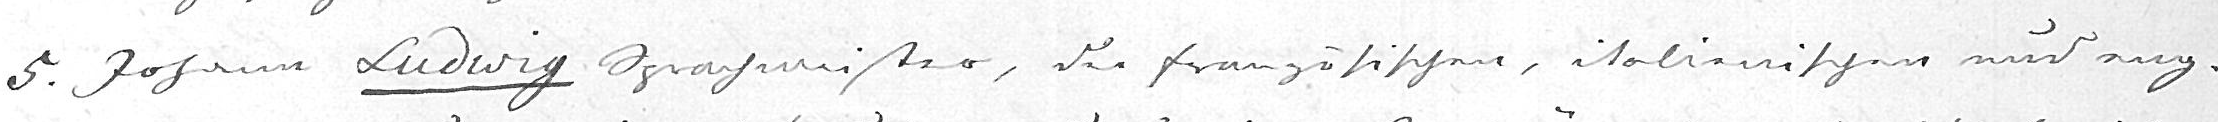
5. Johann Ludwig Sprachmeister, der französischen, italienischen und eng-
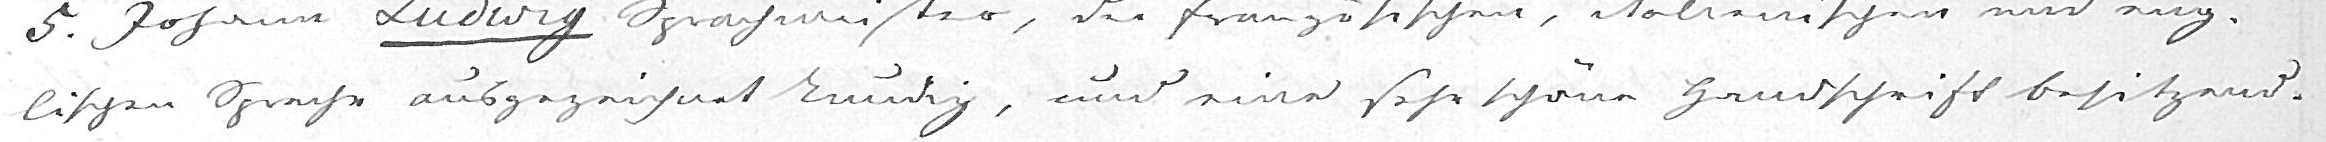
lischen Sprache ausgezeichnet kundig, und eine sehr schöne Handschrift besitzend.
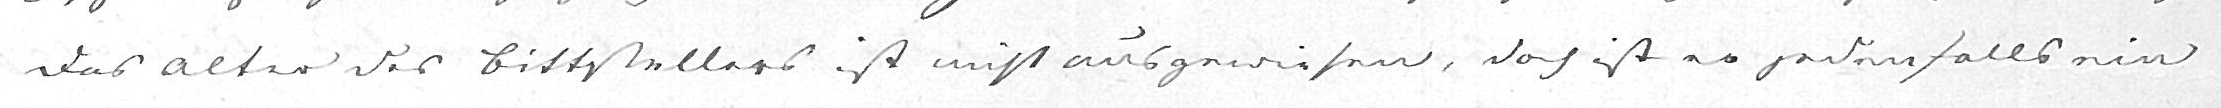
Das Alter des Bittstellers ist nicht ausgewiesen, doch ist er jedenfalls ein
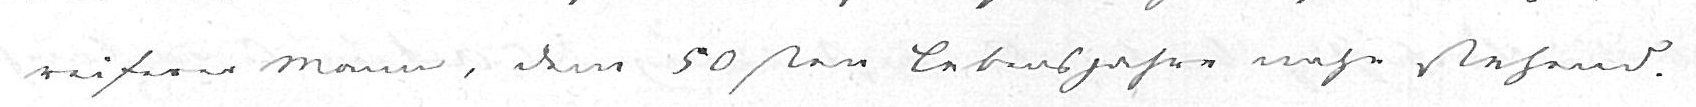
reiferer Mann, dem 50sten Lebensjahr nahe stehend.
